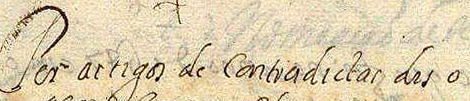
Por artigos de contradictas dis o
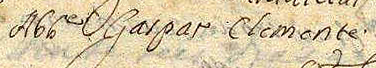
Abbe Gaspar Clemente.
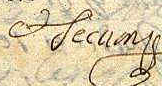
& secuor
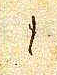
1
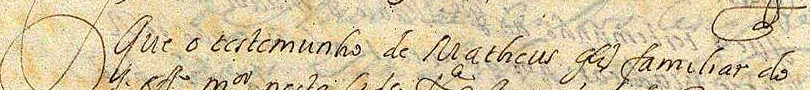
P que o testemunho de Matheus glz̄ familiar do
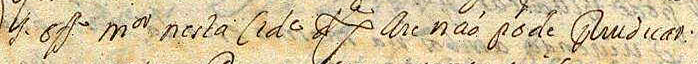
s. offo mor nesta Cide d̄ Lxa lhe naõ pode pRiudicar.
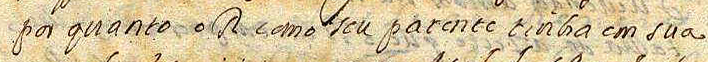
porquanto o R como seu parente tinha em sua
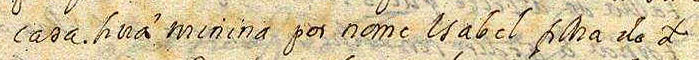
casa huā menina por nome Isabel filha do d̄
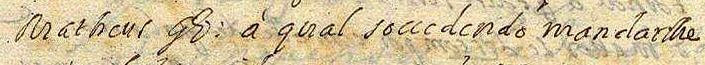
Matheus glz̄: a qual soccedendo mandarlhe
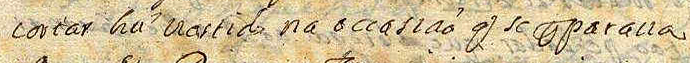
cortar hū uestido na occasiaõ q̄ se p̄paraua
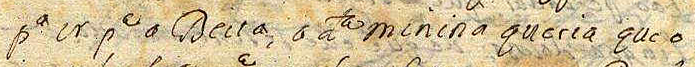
pa ir pa a Beira, a d̄a menina queria que o
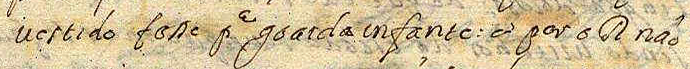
uestido fosse pa goarda enfante: e por o R naõ
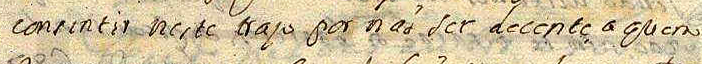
consentir neste trajo por naõ ser decente, a quem
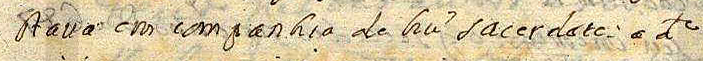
staua em companhia de hū sacerdote: a d̄a
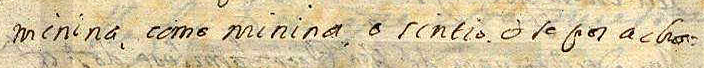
minina, como minina, o sintio & se pos a cho
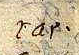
rar.
